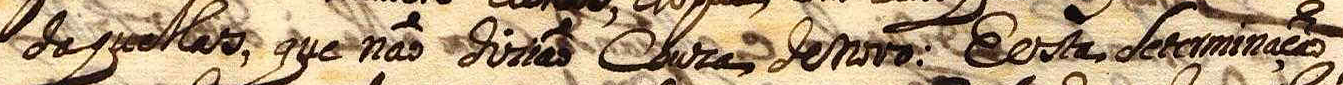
daquellas, que não dizião Couza de novo: E esta determinação
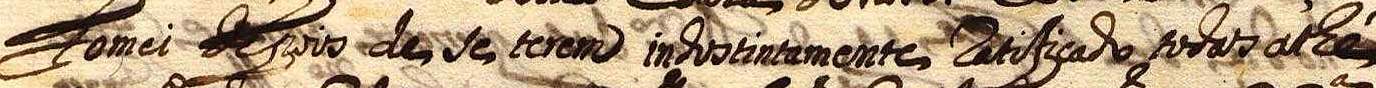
Tomei depois de se terem indistintemente Ratificado todas athé
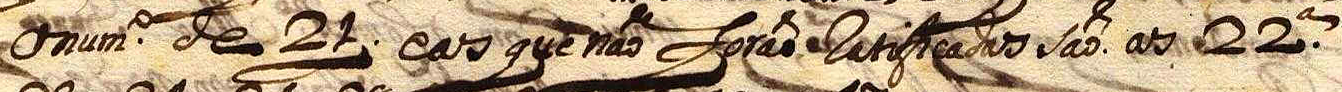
o num.o de 21. e as que não forão Ratificados são as 22a.
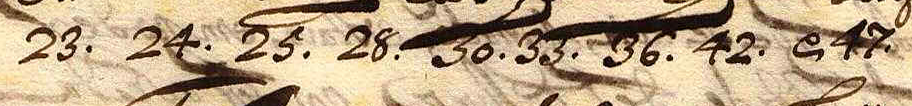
23. 24. 25. 28. 30. 33. 36. 42. e 47.
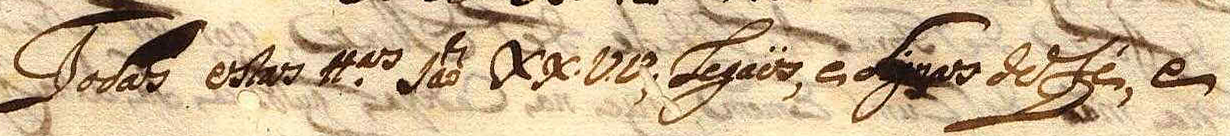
Todas estas tt.as são xx. v.v; Legaes, e dignas de fé, e
